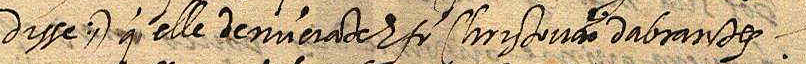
disse:,) q̅ elle denu̅cia̅te E fr̅ Christouão dabrantes.
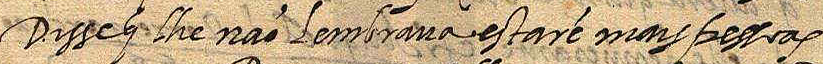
Disse q̅ lhe não Lembraua estare̅ mais pessoas
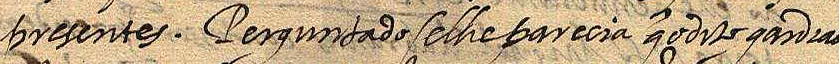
presentes. Perguntado se lhe parecia q̅ o dito gardião
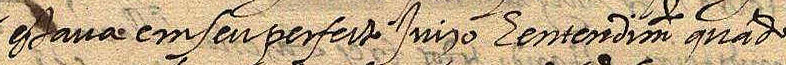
estaua em seu perfeito Juizo E entendimto qua̅do
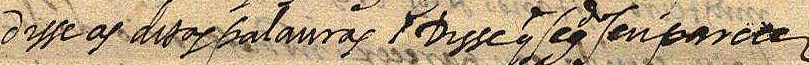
disse as ditas palauras / Disse q̅ segdo seu parecer
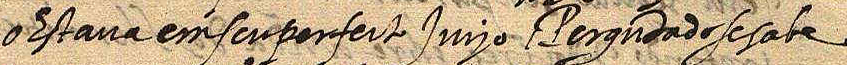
o Estaua em seu perfeito Juizo / Pergu̅tado se sabe
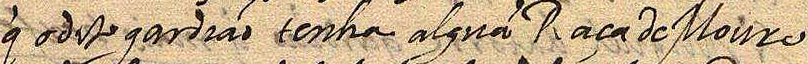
q̅ o dito gardião tenha algua̅ Raça de Mouro
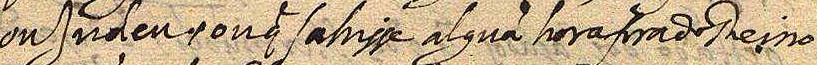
ou Judeu, ou q̅ sahisse algua̅ hora fora do Reino
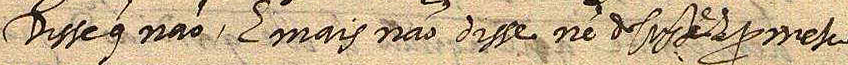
Disse q̅ não, E mais não disse ne̅ do Custe E ꝓmeteo
